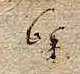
65
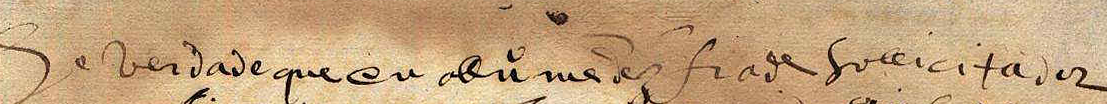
he verdade que eu alluo mēdez frade Sollicitador
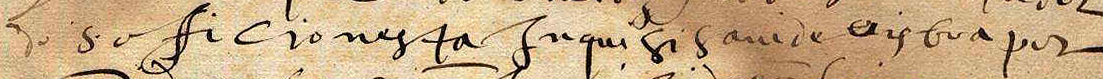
do s. officio nesta Jnquisisam de llisboa por
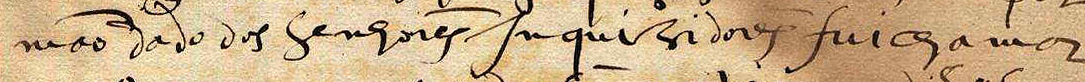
mãodado dos Senhorēs Jnquizidores fui chamar
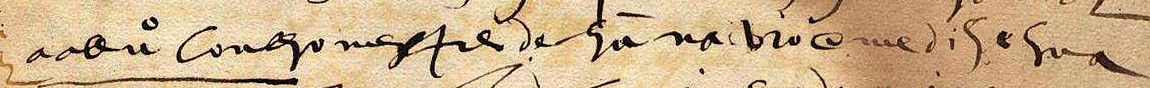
a alluo Coulho mestre de hū navio e me dise hua
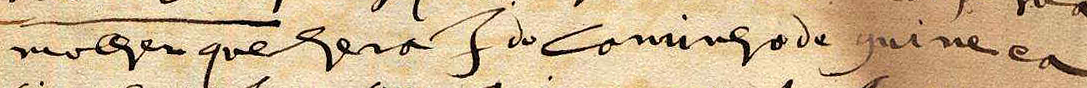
molher que hera Jdo Caminho de guine e a
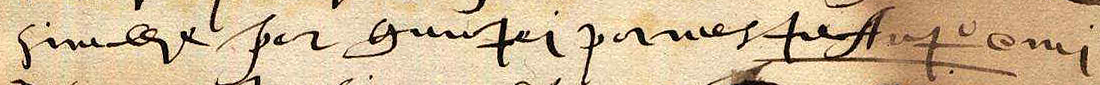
sim lhe perguntej por mestre Anto e mj
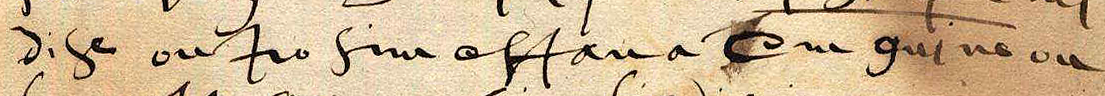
dise outrosim estaua em guine ou
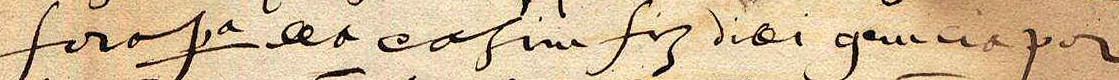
fora ꝑa lla e asim fiz dilligemcia por
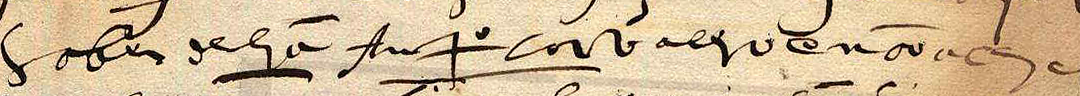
saber de hū Anto carvalho e não achej
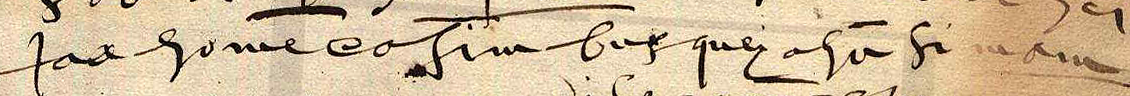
tall homē e asim busquej a hū simam
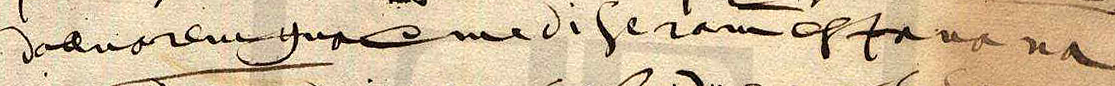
dalluaremgua e me diseram estaua na
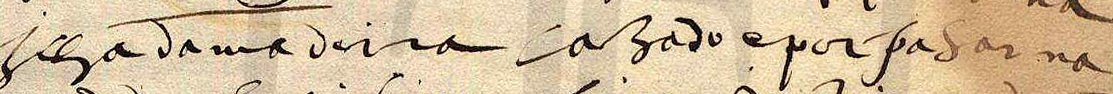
Jlha da madeira cazado e por pasar na
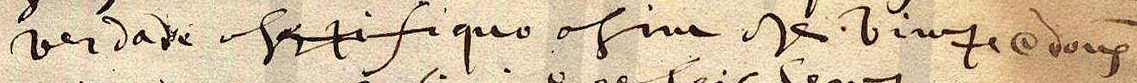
verdade o sertifiquo asim oje vimte e dous
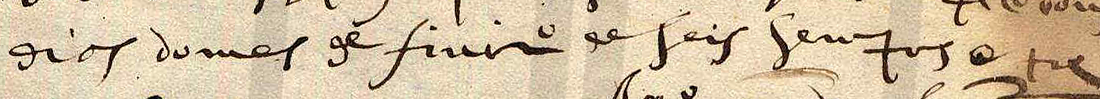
dias do mes de fiuiro de seissentos e tre
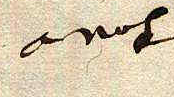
anos
